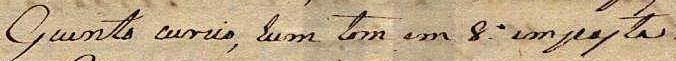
Quinto cursio, hum tom em 8o. em pasta
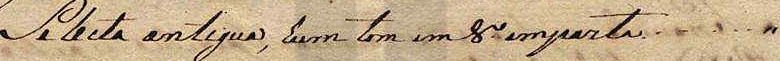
Selecta antigua, hum tom em 8o. em pazta
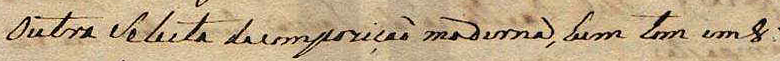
Outra Selecta da compozição moderna, hum tom em 8o.
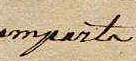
em pazta
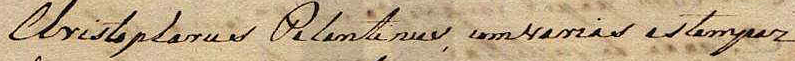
Christopharus Palentinus, com varias estampaz
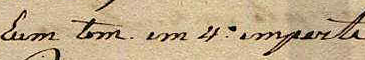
hum tom em 4o. em pazta
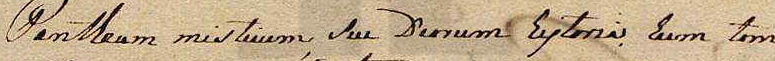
Pantheum misticum, seu Deorum historia hum tom
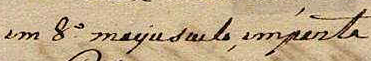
em 8o. mayusculo, em pazta
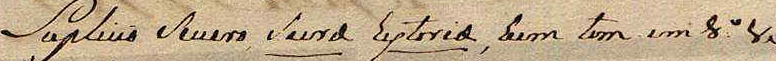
Suplicio Severo, Sacra historia , hum tom em 8o. Ve
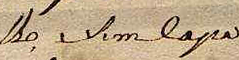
lho e Sem Capa
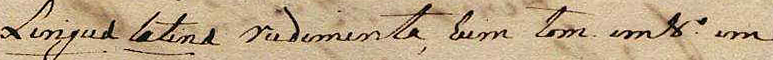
Lingua latina rudimenta, hum tom em 8o. em
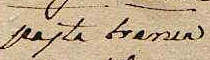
pasta branca
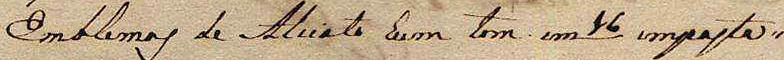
Emblemas de Alciato hum tom em 16 em pasta
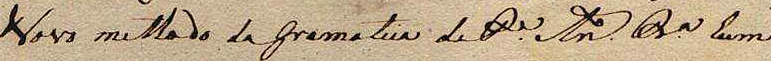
Novo methodo da Gramatica do Pe. Anto. Pra. hum
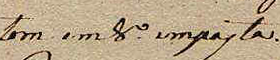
tom em 8o. em pasta.
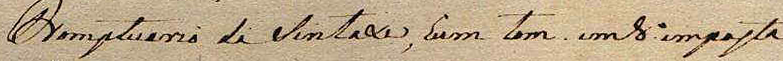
Promptuario da Sintaxe, hum tom em 8o. em pasta
